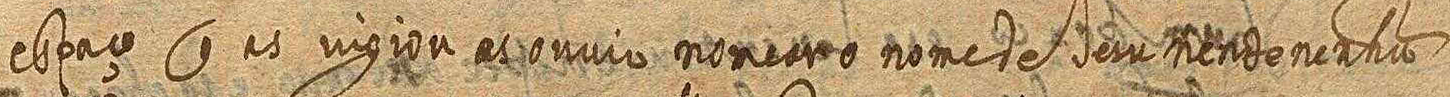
espaço q̄ as uigiou as ouuio nomear o nome de Iesu nen de nenhū
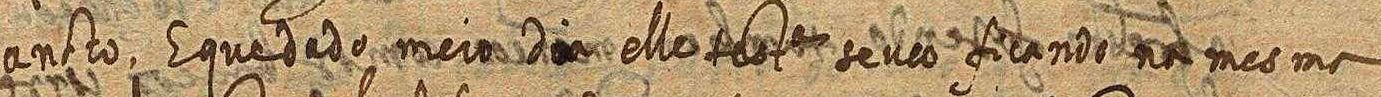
sancto. E que dado meio dia elle testa se ueo ficando na mesma
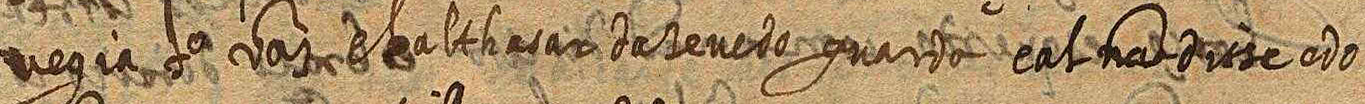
uegia Io vāz e balthasar dazeuedo guarda e al não disse e do
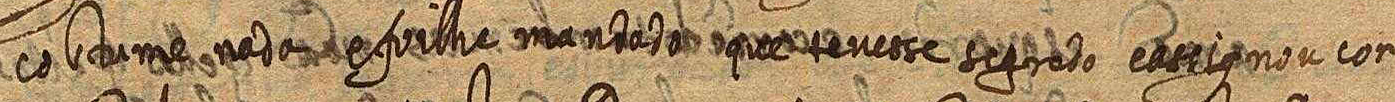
costume nada e foilhe mandado que teuesse segredo e assignou con
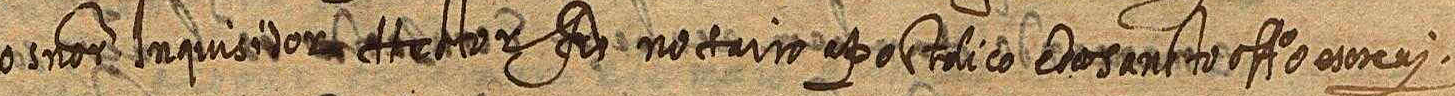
o snōr Inquisidor Hector f̄rs notairo apostolico e do sancto offo o escreuj.
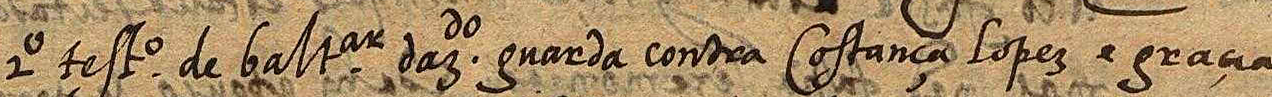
2o testo. de balt.ar daz.do guarda contra Costança lopez e graçia
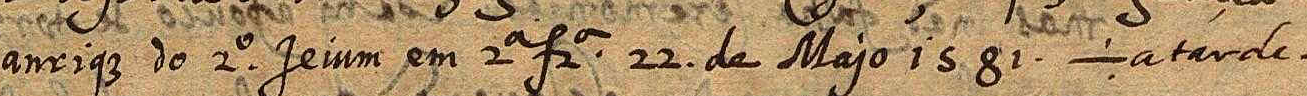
anriqz do 2.o Jeium em 2.a fr.a 22. de Majo i58i — a tarde.
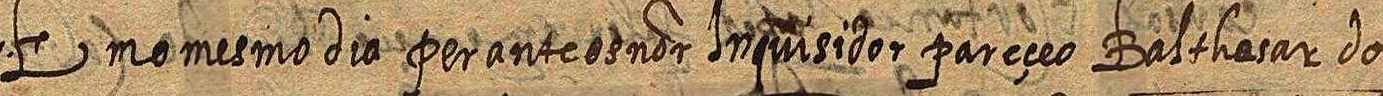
Em o mesmo dia perante o snōr Inquisidor pareçeo Balthasar da
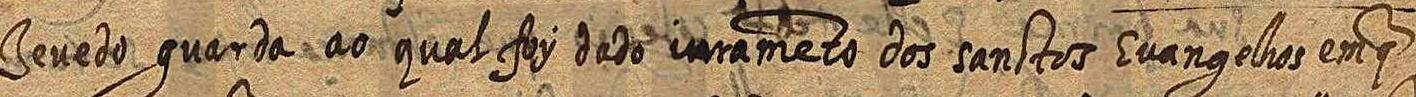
zeuedo guarda ao qual foy dado iuram̄eto dos sanctos Euangelhos em q̄
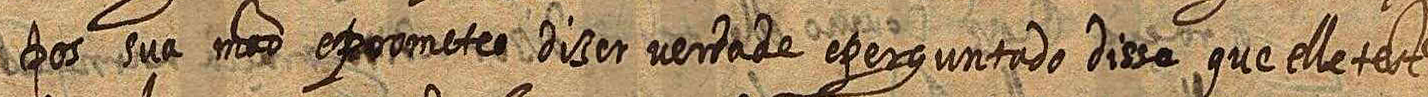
pos sua mão e prometeo dizer uerdade e perguntado disse que elle testa
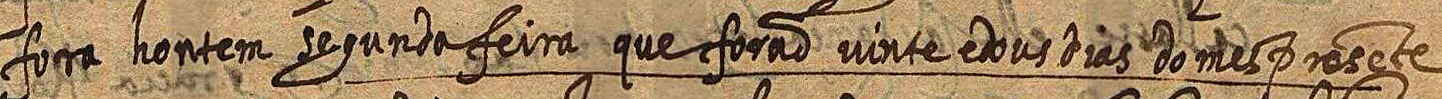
fora hontem segunda feira que forão uinte e dous dias do mes presēte
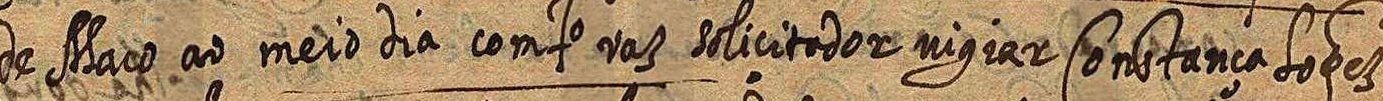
de Maio ao meio dia com Jo vaz solicitador uigiar Constança Lop̄ez
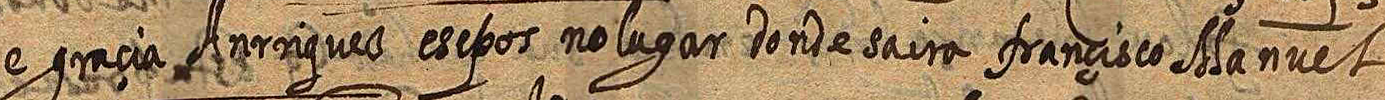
e graçia Anrriques e se pos no lugar donde saira françisco Manuel
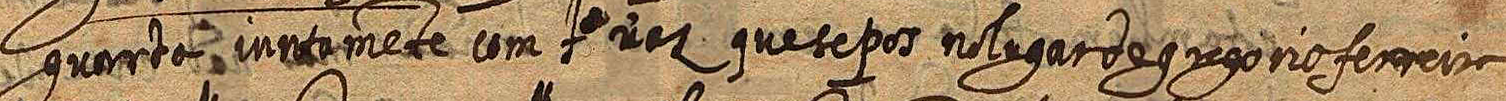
guarda iuntamēte com Io uaz que se pos no lugar de gregorio ferreira
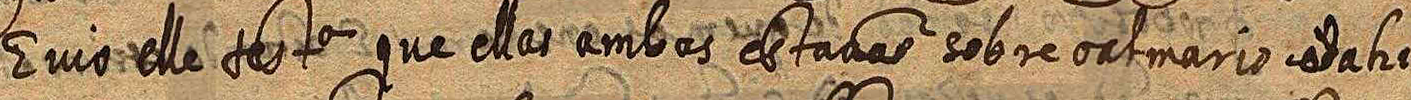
E uio elle testa que ellas ambas estauão sobre o almario e dahi
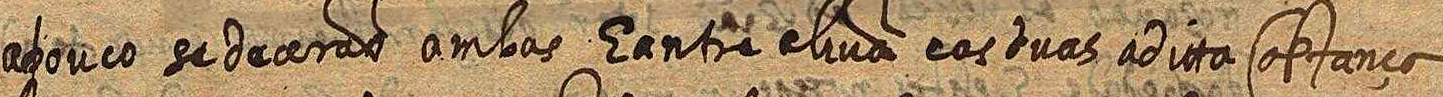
a pouco se decerão ambas E antre a huā e as duas a ditta Costança
